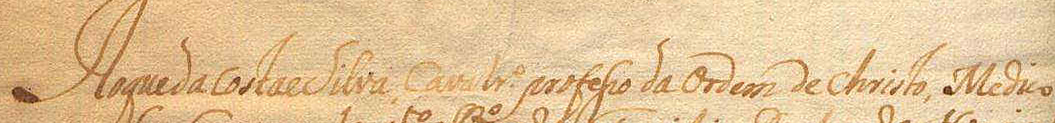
Roque da costa e Silva, Cavalr.o professo da Ordem de christo, Medico
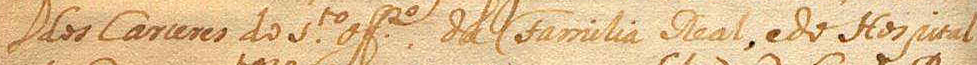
dos Carceres do s.to off.o da Familia Real, e do Hospital
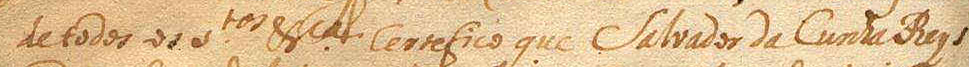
de todos os s.tos &.a Certefico que Salvador da Cunha Reys
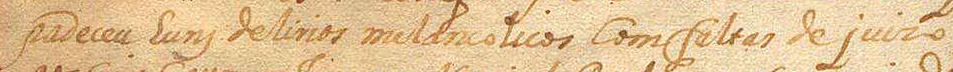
padeceu huns delirios melancolicos Com faltas de juizo,
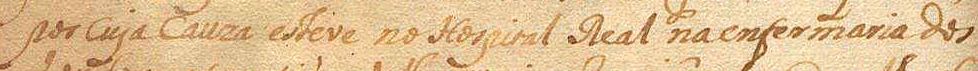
por cuja cauza esteve no Hospital Real na enfermaria dos
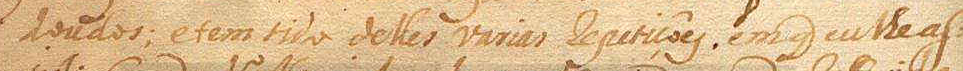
doudos; e tem tido delles varias Repetições, em q̄ eu lhe as
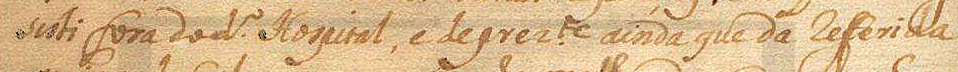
sisti fora do d.o Hospital, e de prez.te ainda que da Referida
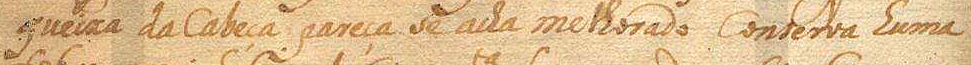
queixa da Cabeça, pareça se acha melhorado Conserva huma
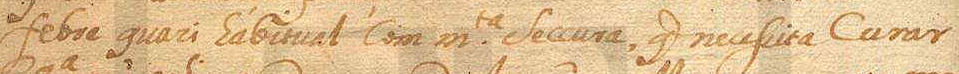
febre quazi habitual com m.ta seccura, q̄ necessita Curar
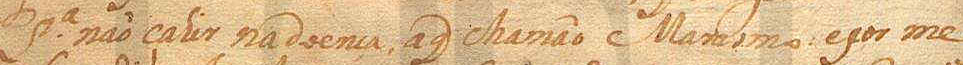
p.a naõ cahir na doença, a q̄ chamão Marasmo, e por me
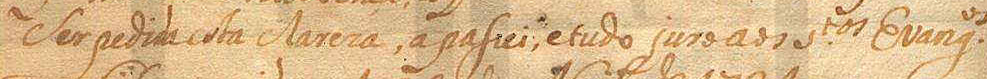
ser pedida esta clareza, e passei, e tudo juro aos s.tos Evang.os
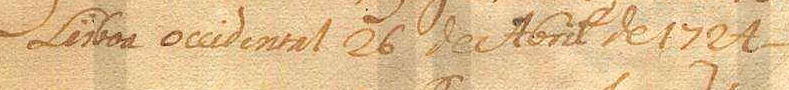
Lisboa occidental 26 de Abril de 1724
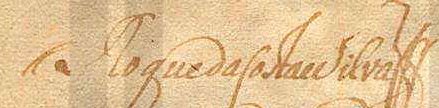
Roque da Costa e Silva
